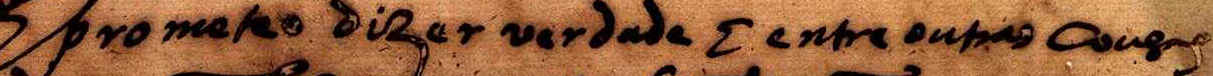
E prometeo dizer verdade E entre outras cousas
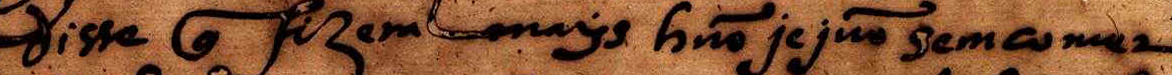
disse q̄ fizera mays hūs jejūs sem comer
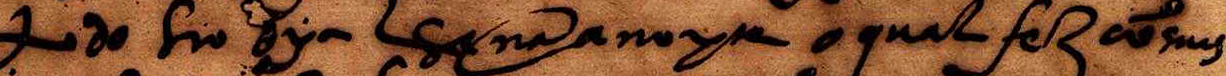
todo ho dya senā a noyte o quaL fez cō suas
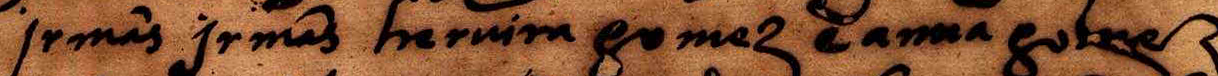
jrmās jrmās heruira gomez e anna gomez
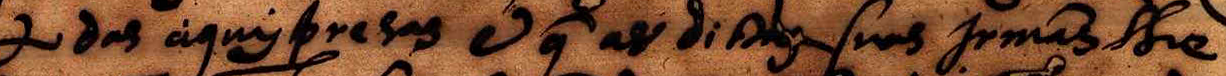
todas aquy presas e q̄ as dictas suas Jrmās lhe
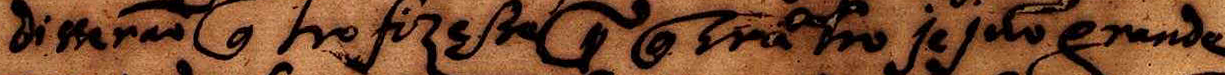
disserão q̄ ho fizesse p̄oq̄ Era ho jejuō grande
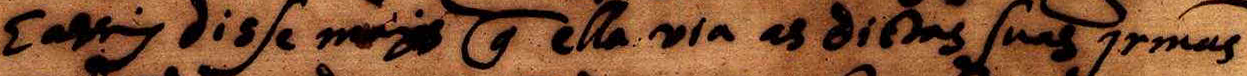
E assy disse mays q̄ ella via as dictas suas jrmās
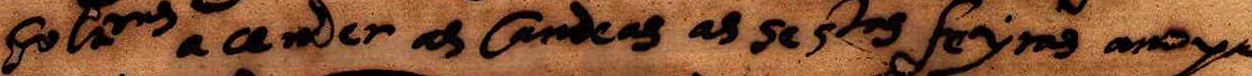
soltras acender as Candeas as sestas feyras a noyte
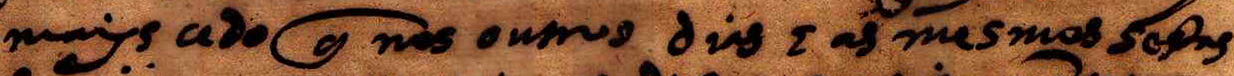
mays cedo q̄ nos outros dias E as mesmas sestas
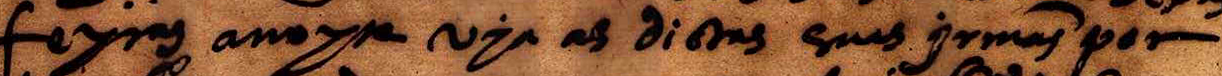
feyras a noyte vya as dictas suas jrmās por
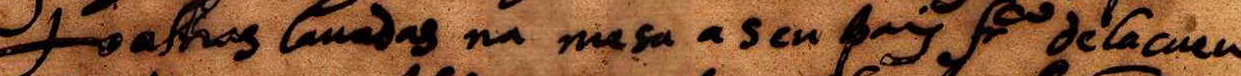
toalhas lauadas na mesa a seu pay frco de la cueua
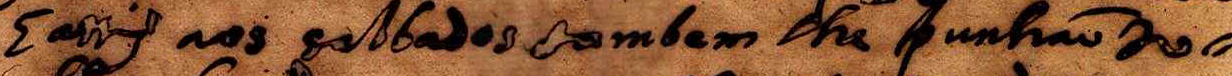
E assy aos sabbados tambem lhe punhaõ to
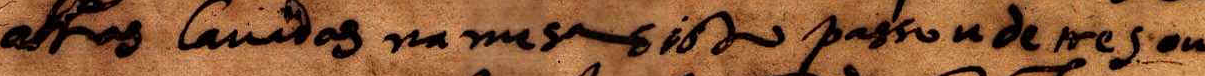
alhas lauadas na mesa E isto passou de tres ou
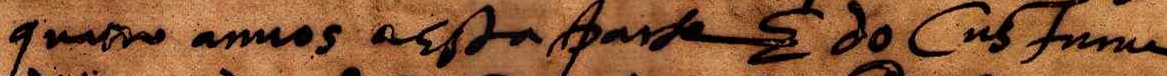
quatro annos a Esta parte E do Custume
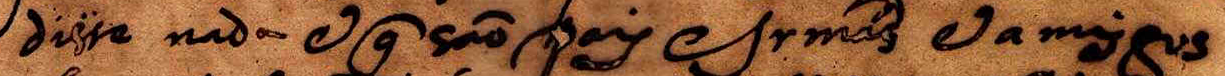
disse nada e q̄ saõ pay e Jrmās e amygos
